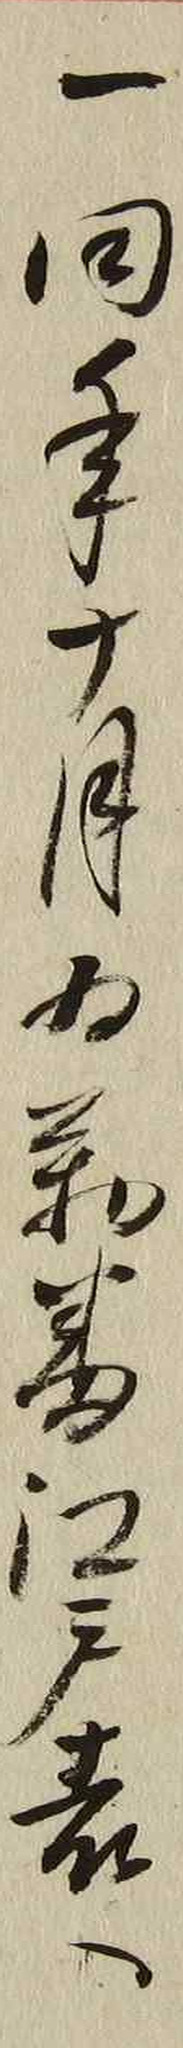一同年十月為勤番江戸表へ
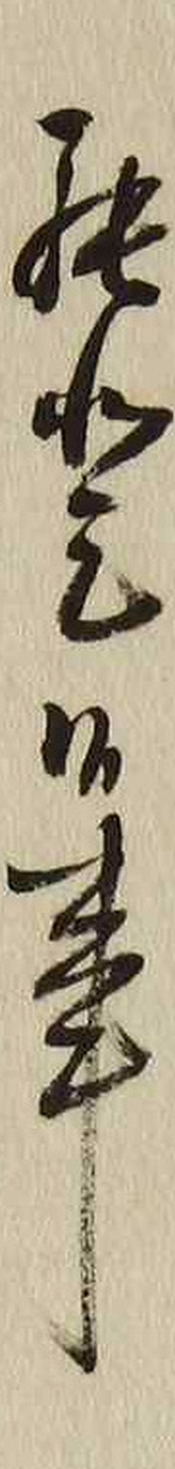罷登候事
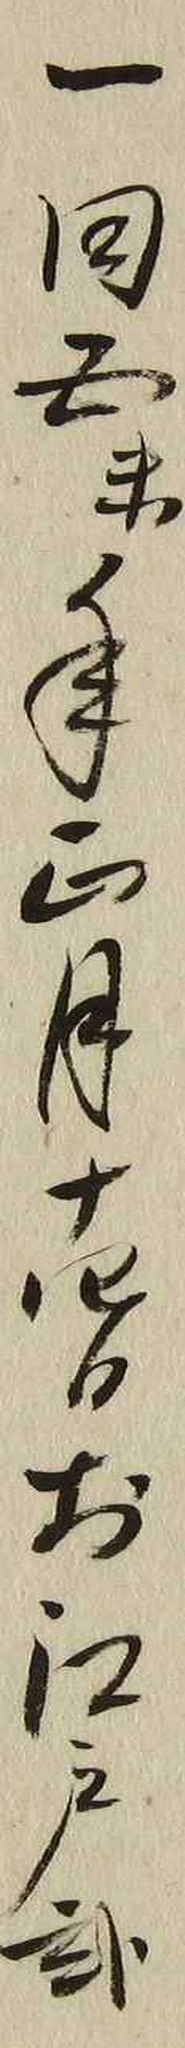一同五未年正月十四日於江戸弐
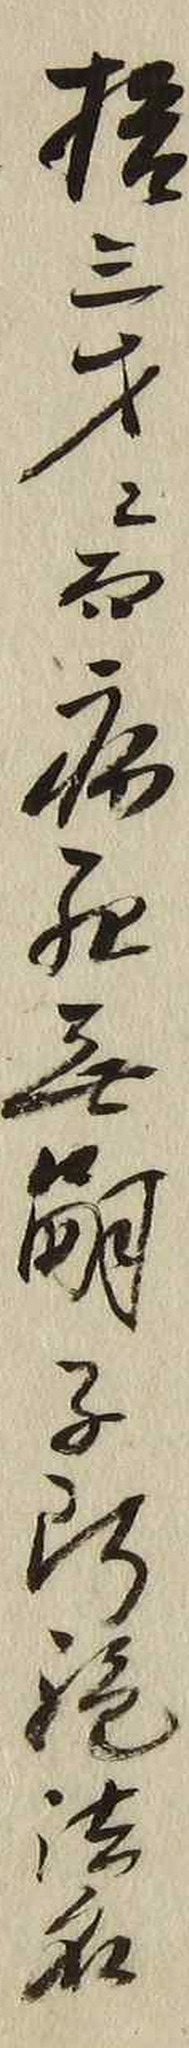拾三才ニ而病死無嗣子断絶法名
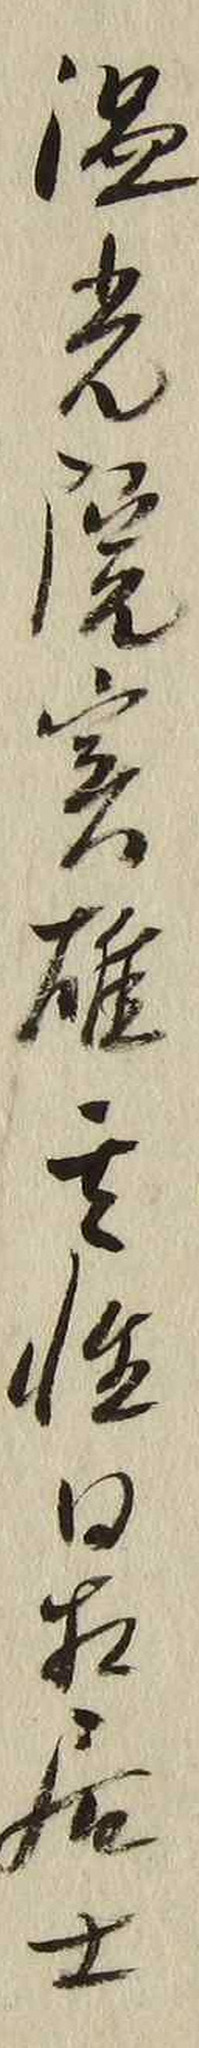温光院実雄玄性日相居士
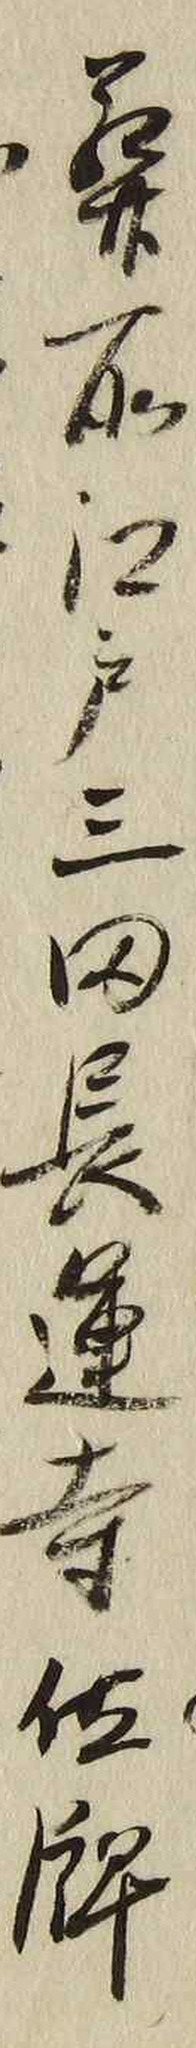葬所江戸三田長運寺位牌
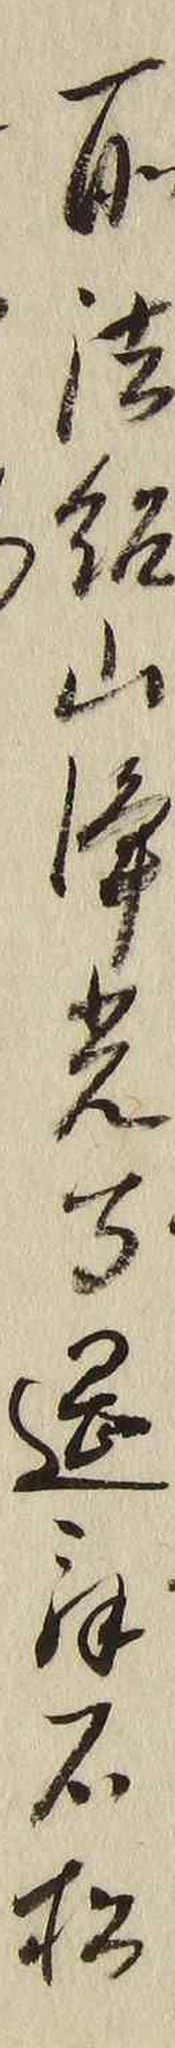所法紹山浄光寺遥拝石松
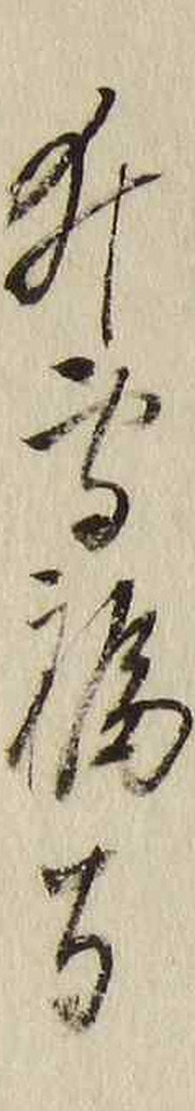井専福寺

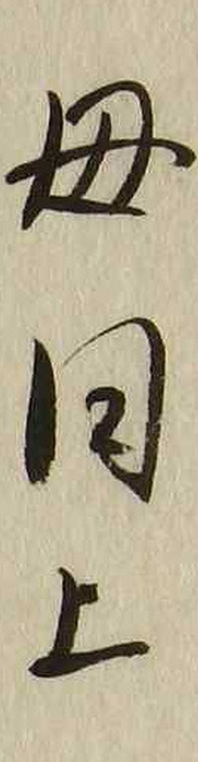母同上
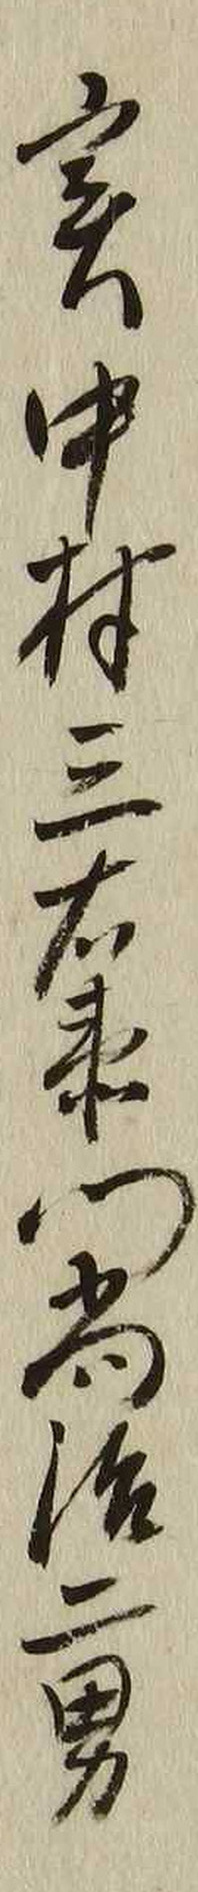実中村三右衛門尚治二男
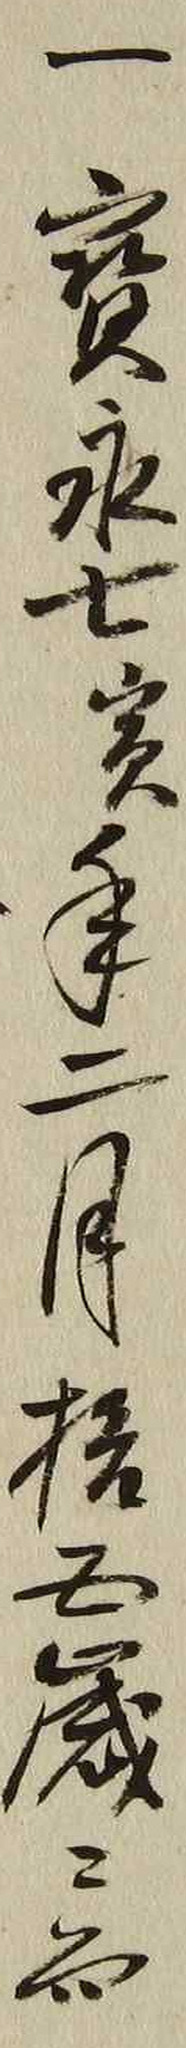一宝永七寅年二月拾五歳ニ而
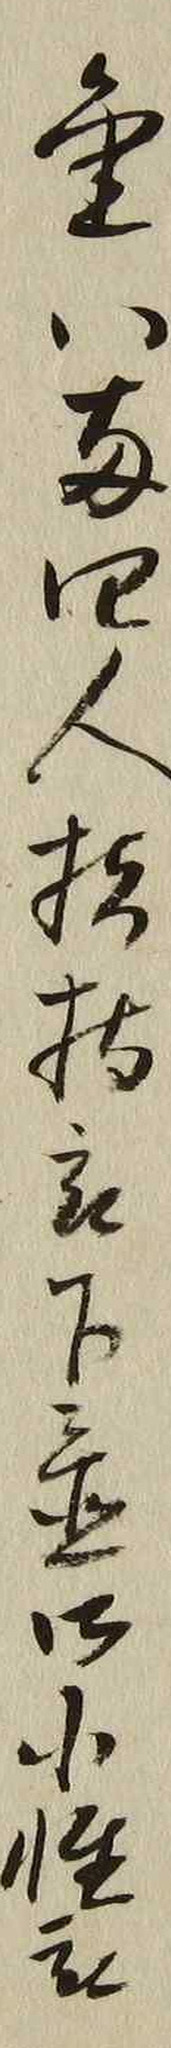金八両四人扶持被下置御小性被
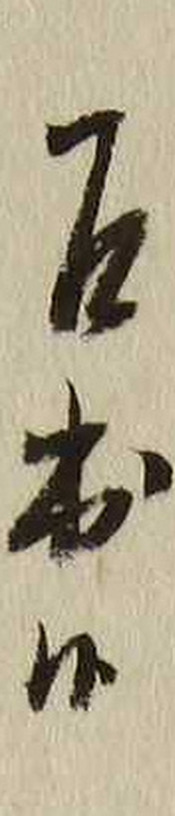召出候
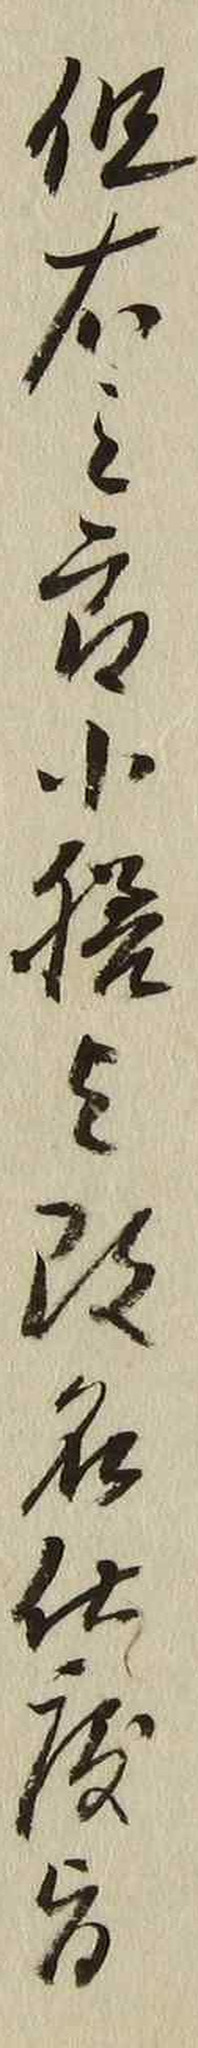但右之節小膳与改名仕度旨
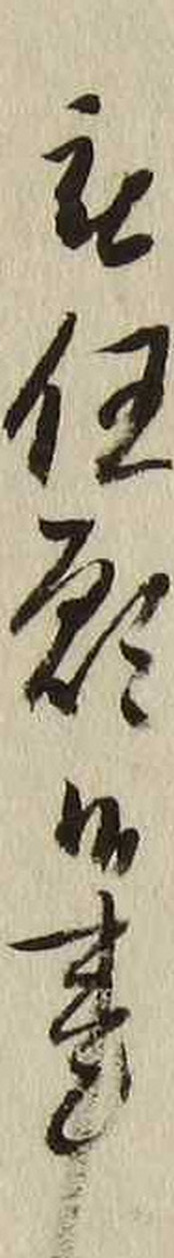被任願候事
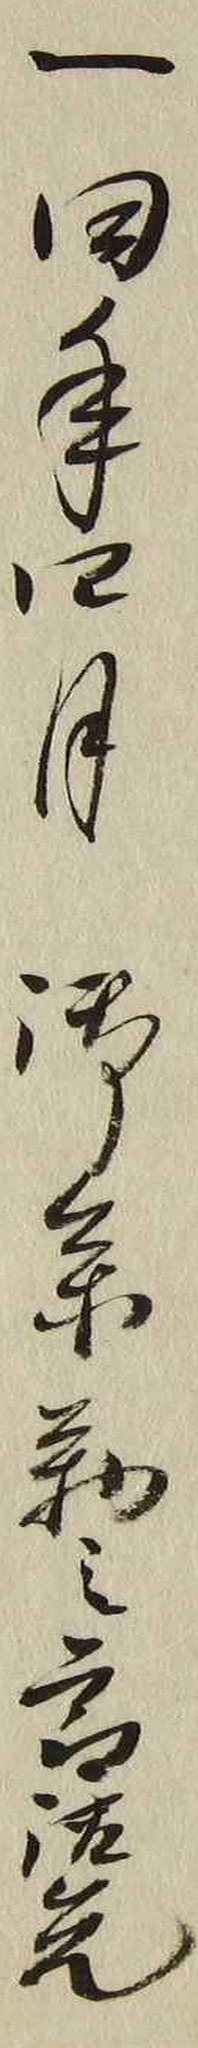一同年四月御参勤之節御先
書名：諸士系譜　巻之355　す之部5
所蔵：会津若松市立会津図書館
